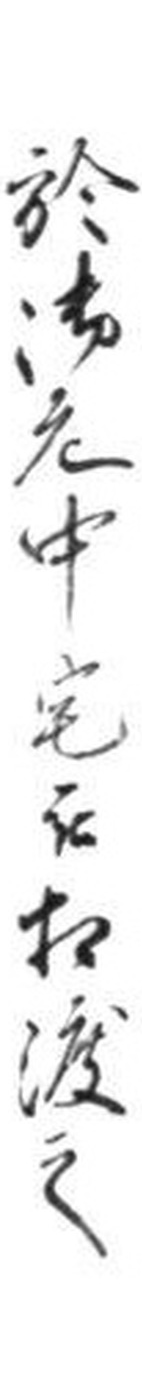於御老中宅被相渡之
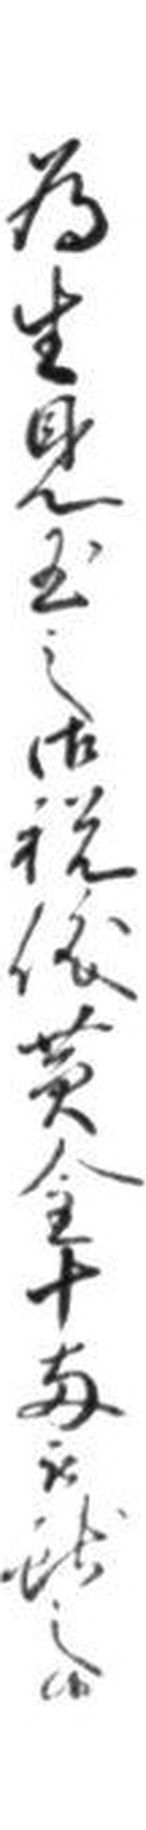為生見玉之御祝儀黄金十両被献之候
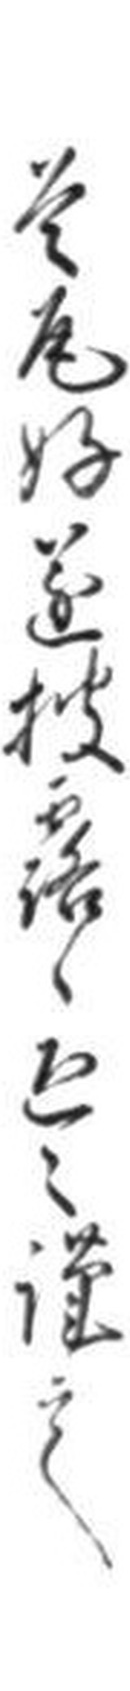首尾好遂披露候恐々謹言
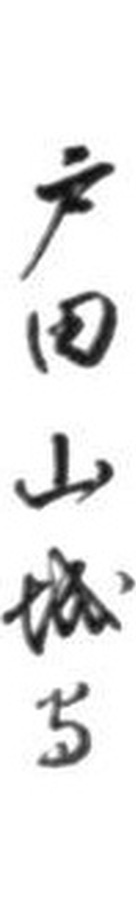戸田山城守
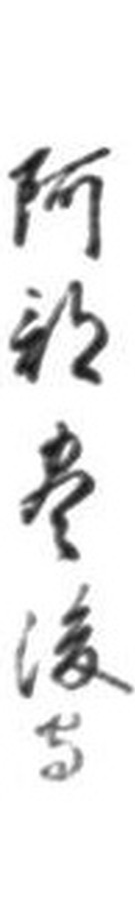阿部豊後守
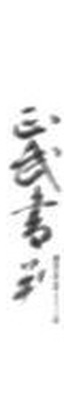正武書判
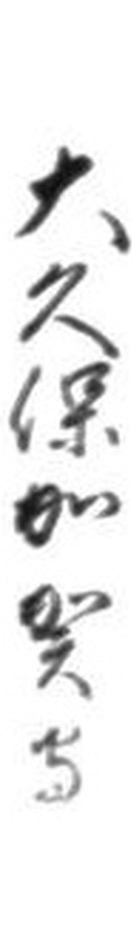大久保加賀守
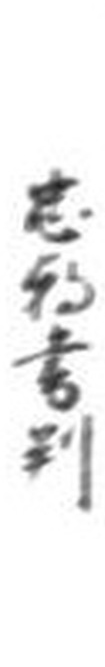忠朝書判
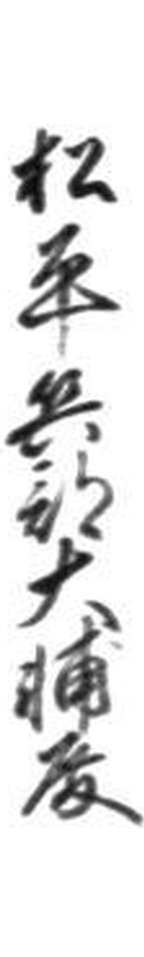松平兵部大輔殿
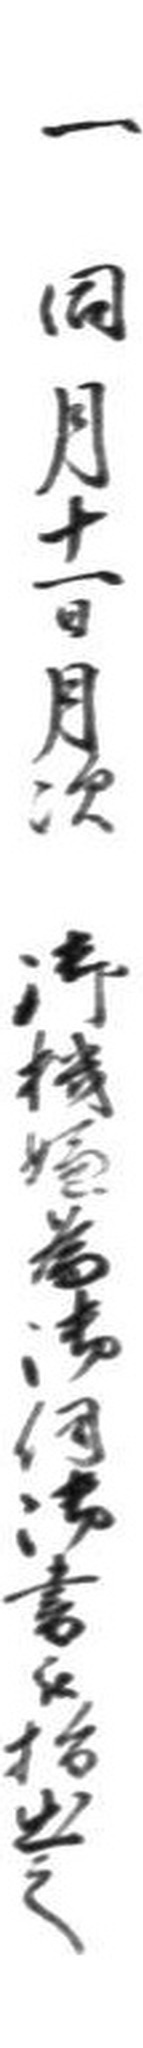一同月十一日月次御機嫌為御伺御書被指出之
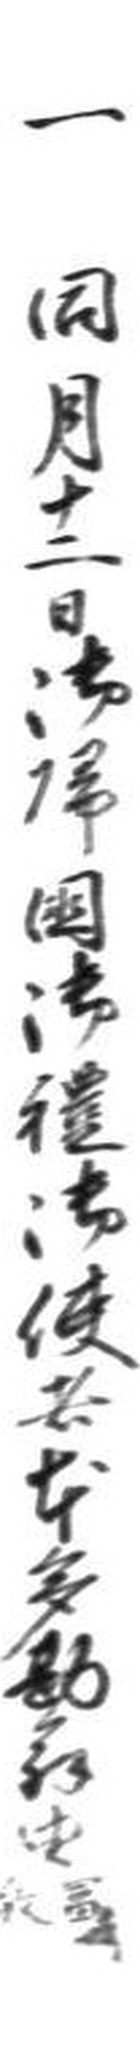一同月十二日御帰国御礼御使者本多勘解由冨敬
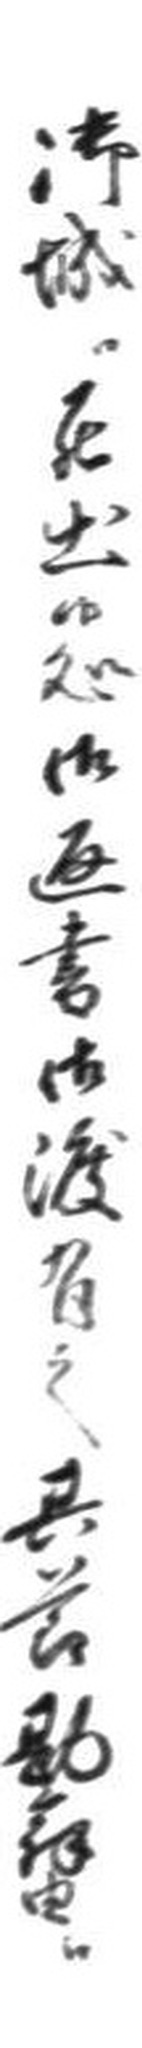御城江罷出候処御返書御渡有之其節勘解由江

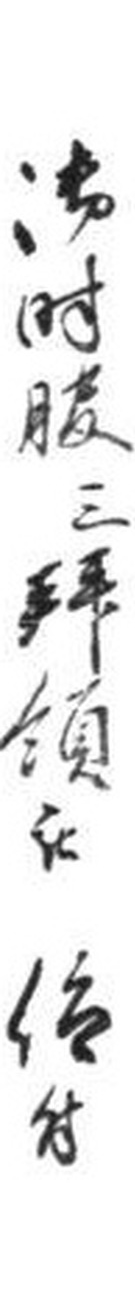御時服三拝領被仰付
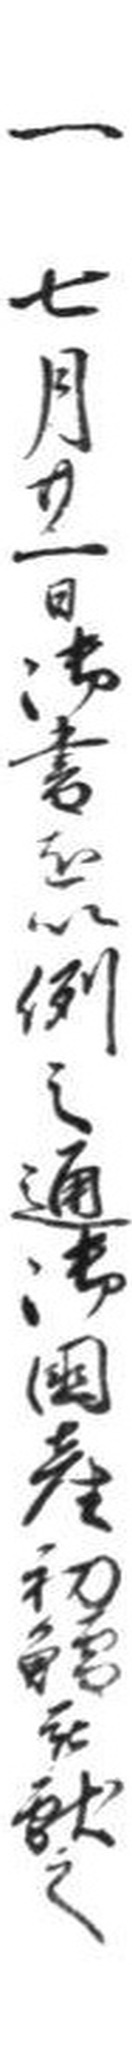一七月廿一日御書を以例之通御国産初鱈被献之
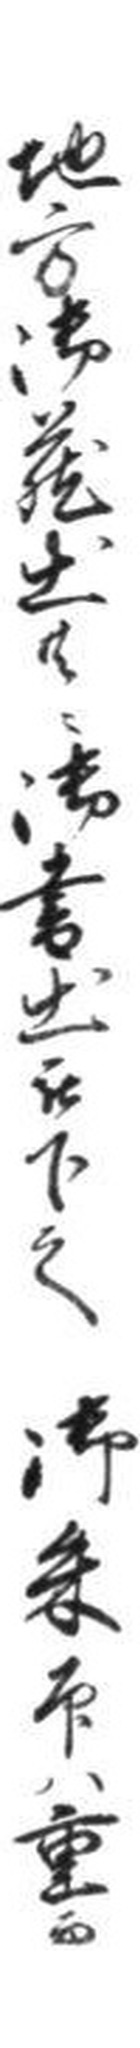地方御蔵出共に御書出被下之御朱印は重而
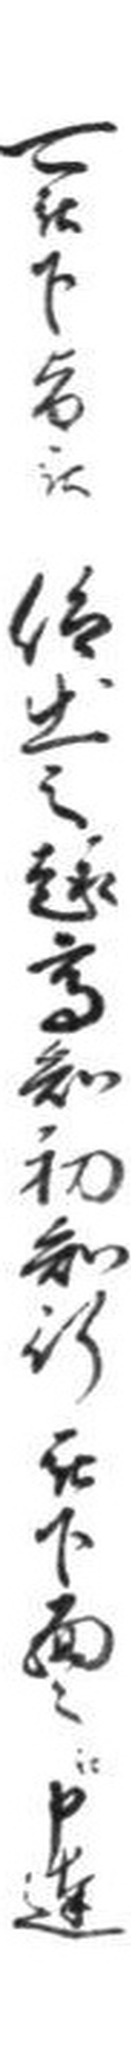可被下旨被仰出之趣高知初知行被下面々え申達
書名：家譜 十六 吉品公 従貞享三年閏三月到同四年
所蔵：福井県文書館 Fukui Prefectural Archives
